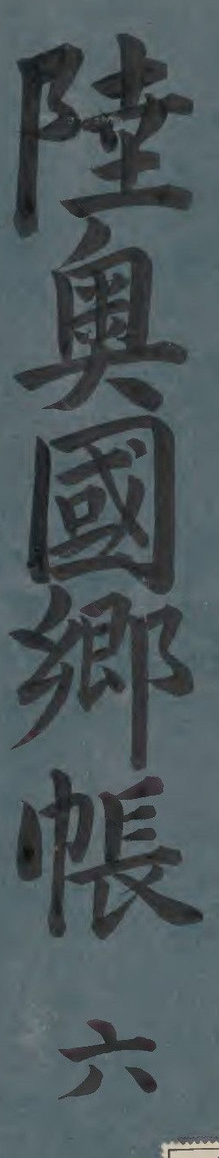陸奥国郷帳六

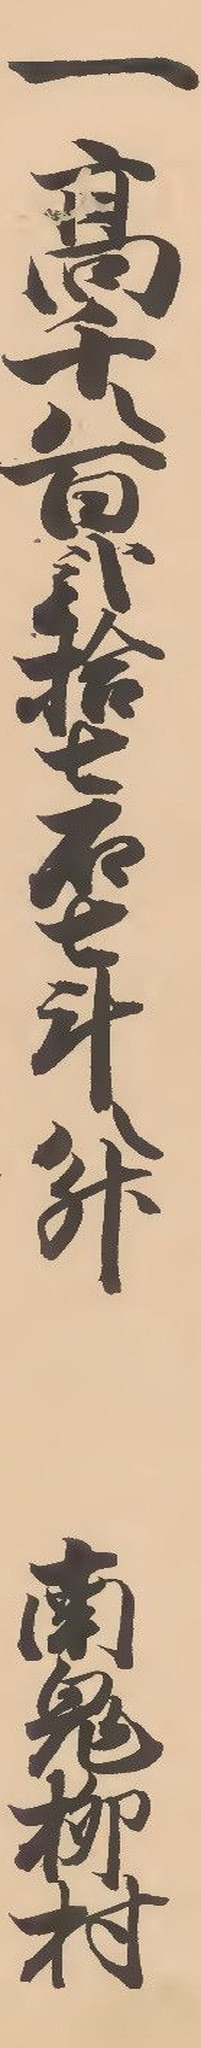一高千八百弐拾七石七斗八升南鬼柳村
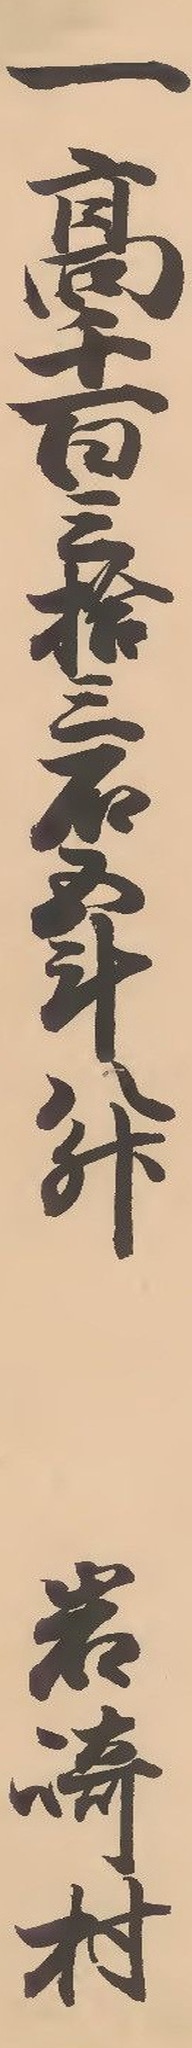一高千百三拾三石五斗八升岩崎村

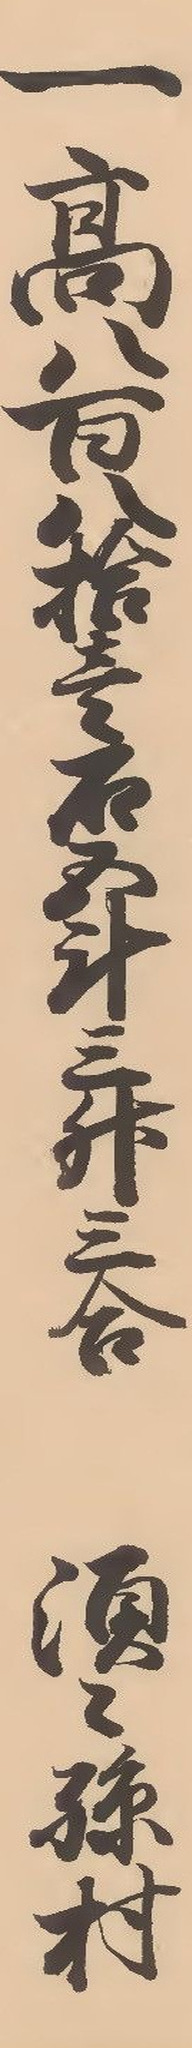一高八百八拾壱石五斗三升三合須々孫村
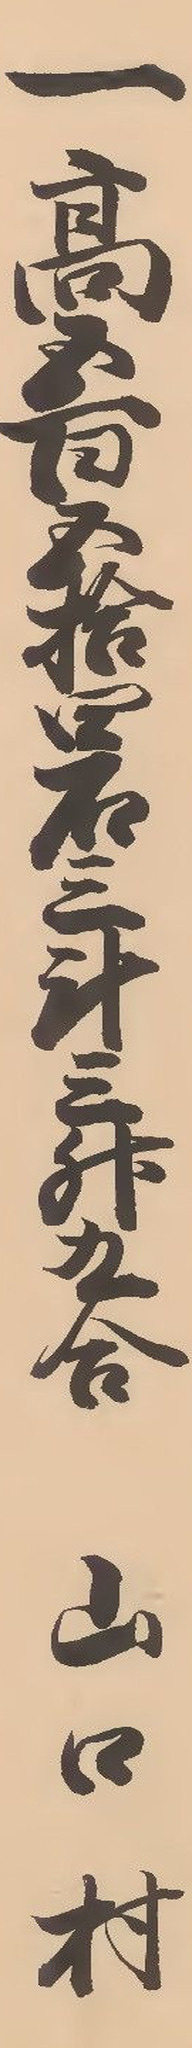一高五百五拾四石三斗三升九合山口村
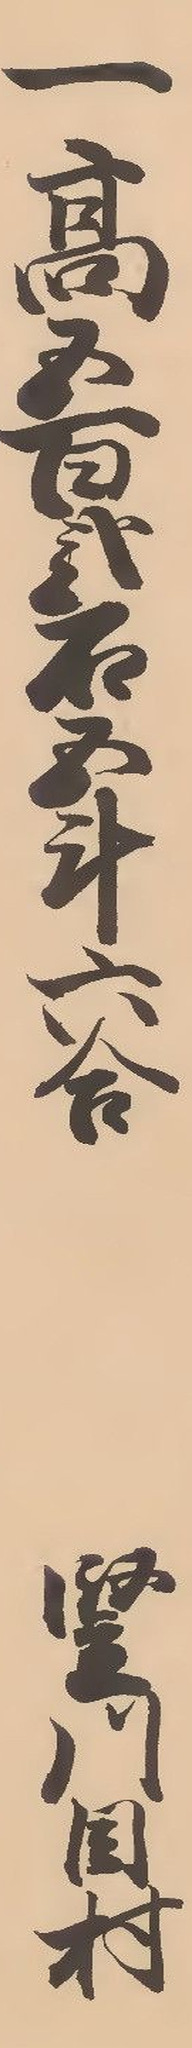一高五百弐石五斗六合竪川目村
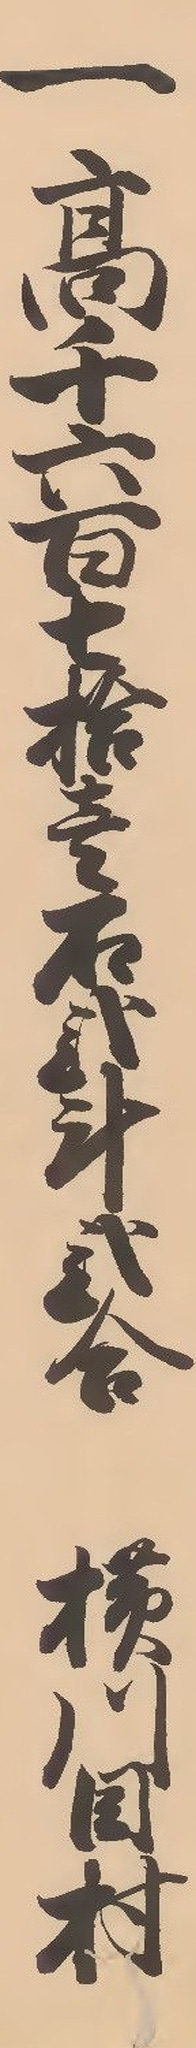一高千六百七拾壱石弐斗弐合横川目村
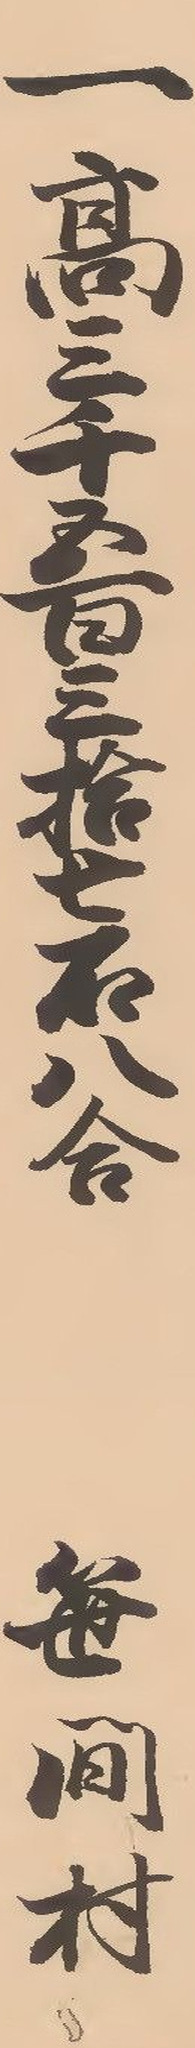一高三千五百三拾七石八合笹間村
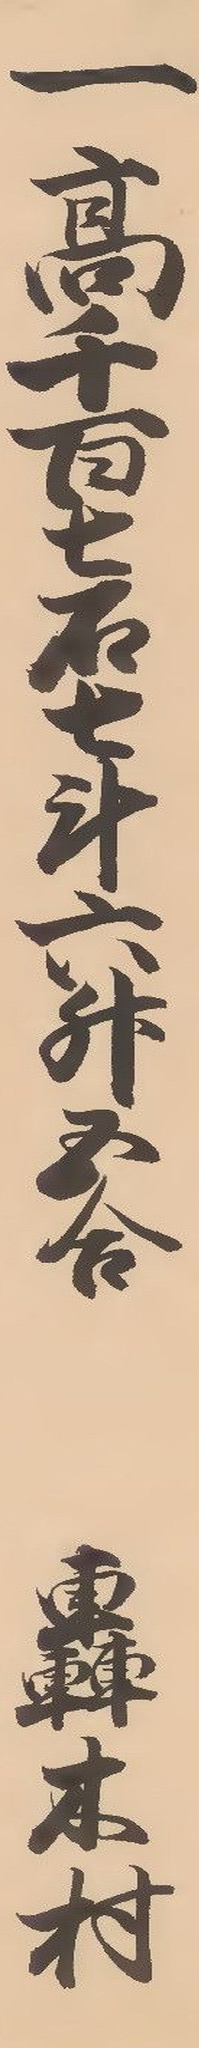一高千百七石七斗六升五合轟木村
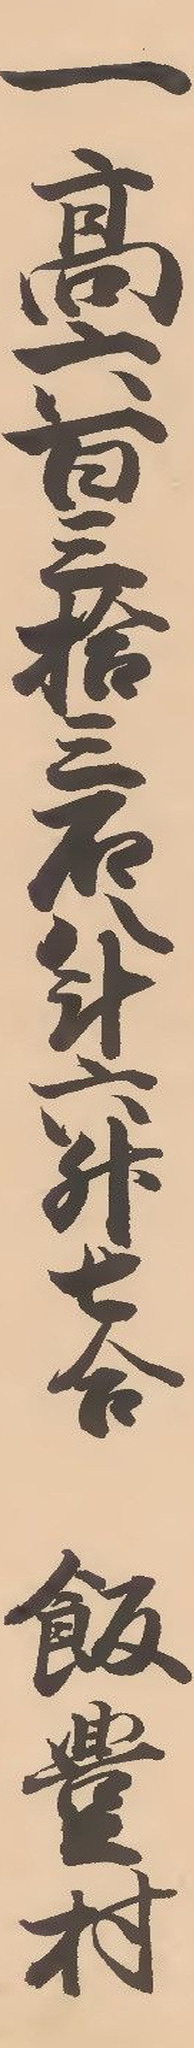一高六百三拾三石八斗六升七合飯豊村
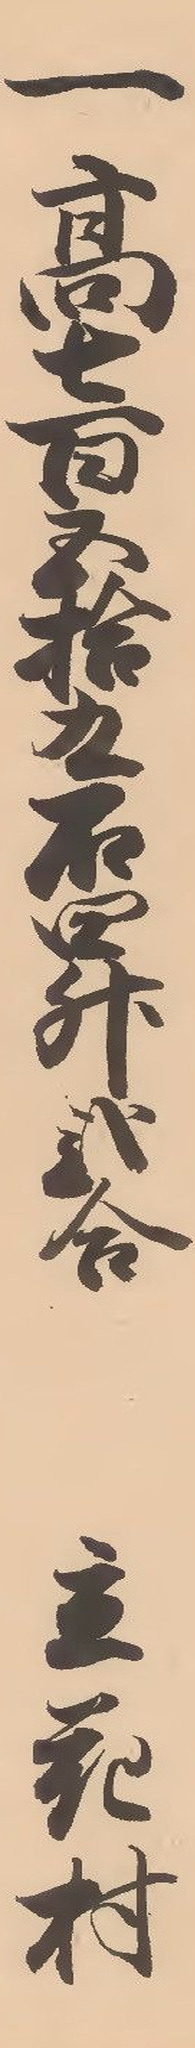一高七百五拾九石四升弐合立花村

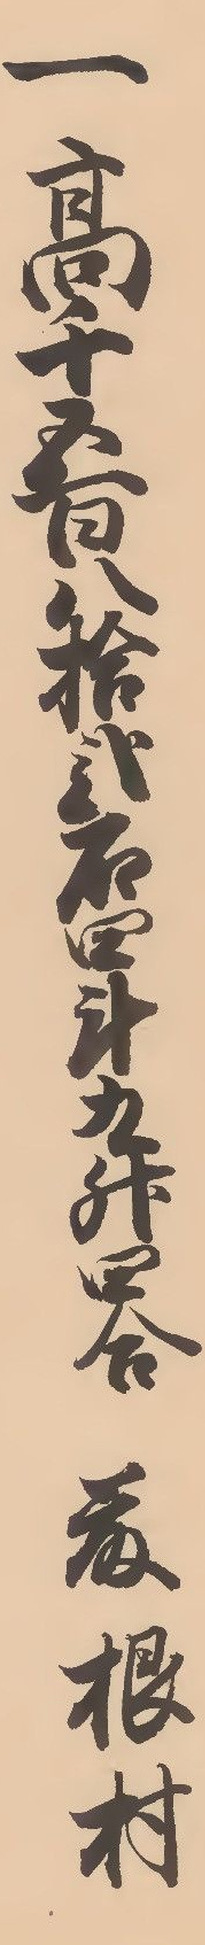一高千五百八拾弐石四斗九升四合藤根村
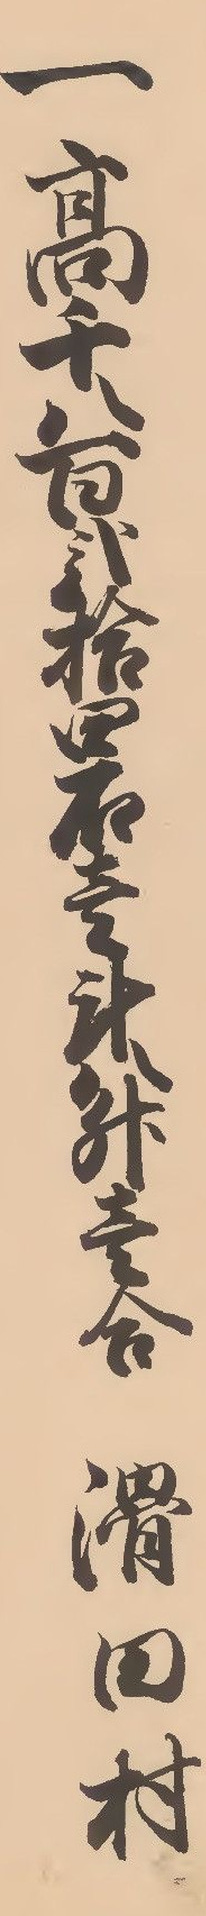一高千八百弐拾四石壱斗八升壱合滑田村
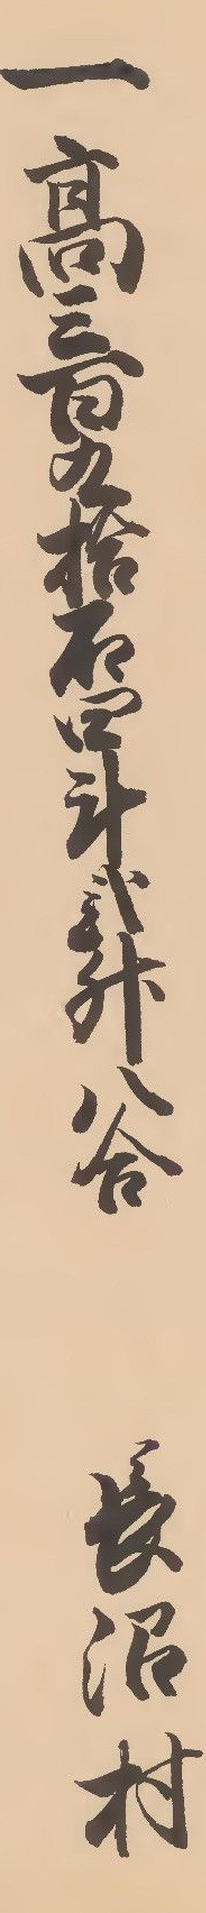一高三百九拾石四斗弐升八合長沼村
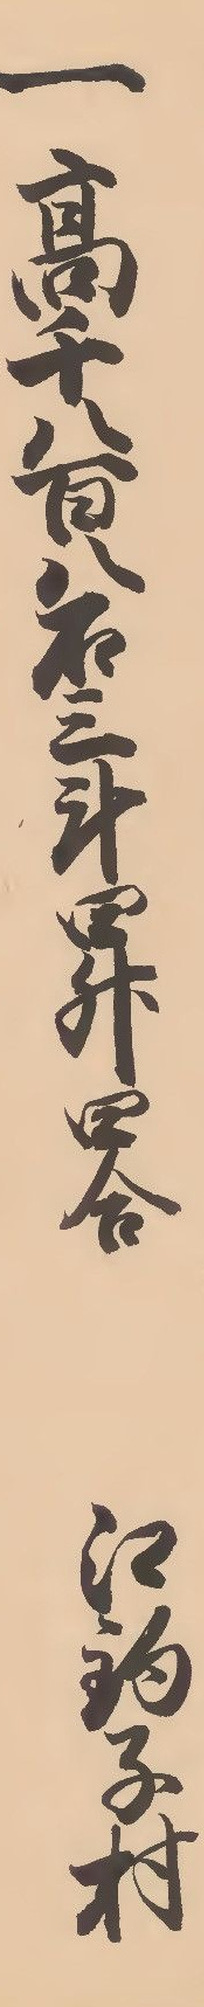一高千八百八石三斗四升四合江釣子村
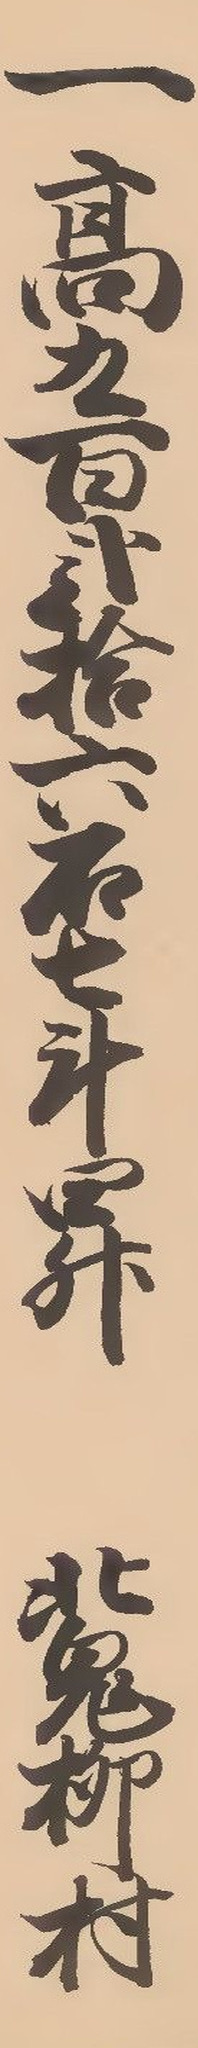一高九百弐拾六石七斗四升北鬼柳村
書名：陸奥国郷帳　６
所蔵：国立公文書館 National Archives of Japan
